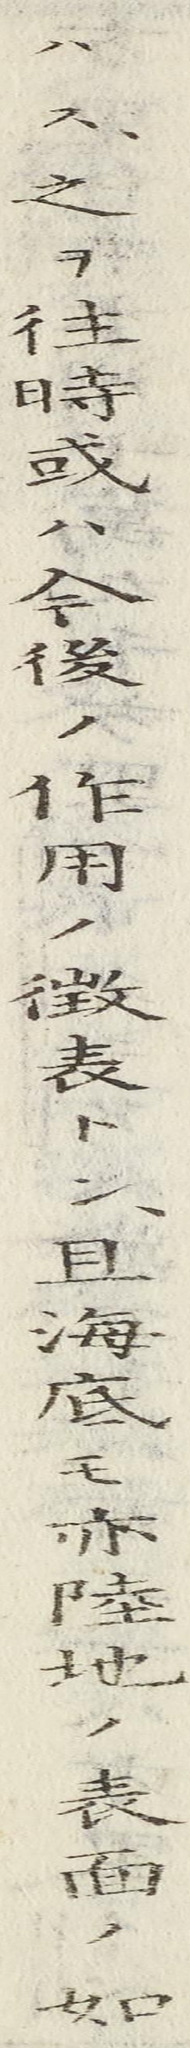ハス、之ヲ往時或ハ今後ノ作用ノ徴表トシ、且海底モ亦陸地ノ表面ノ如
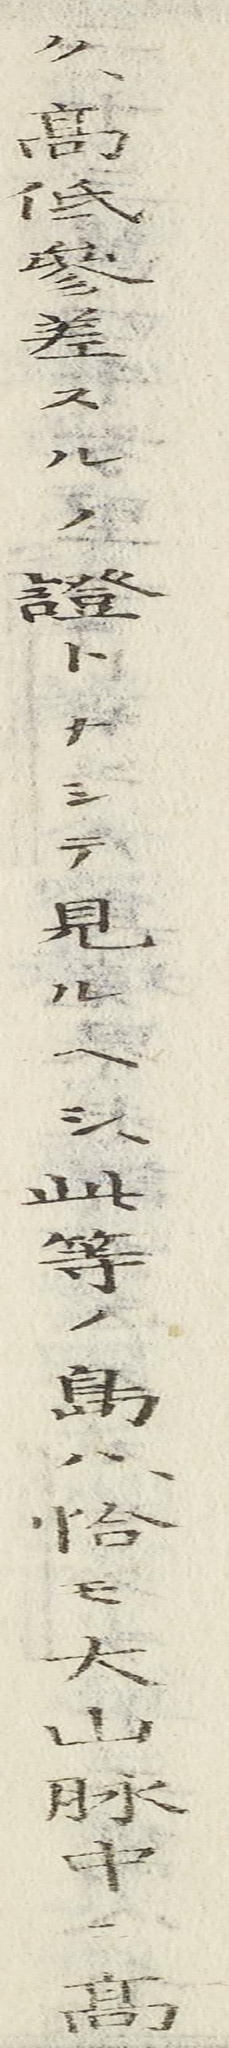ク、高低参差スルノ証トナシテ見ルヘシ、此等ノ島ハ、恰モ大山脉中ニ高
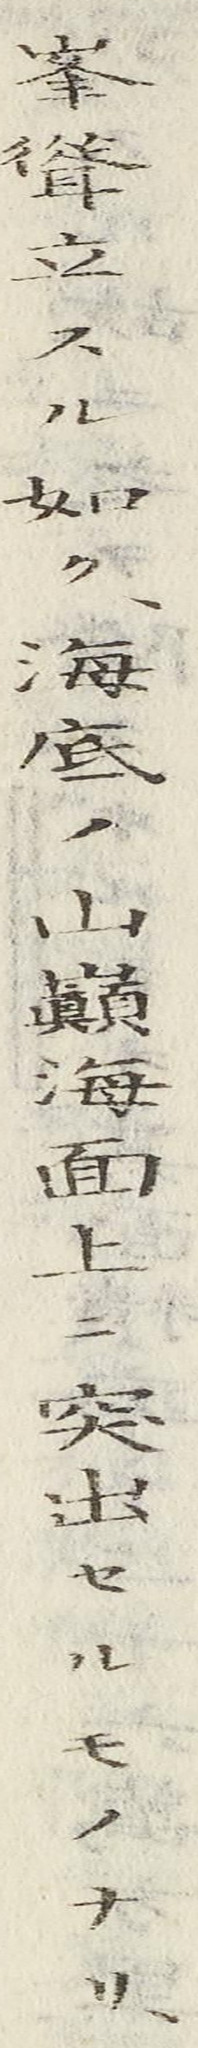峯聳立スル如ク、海底ノ山巓海面上ニ突出セルモノナリ、
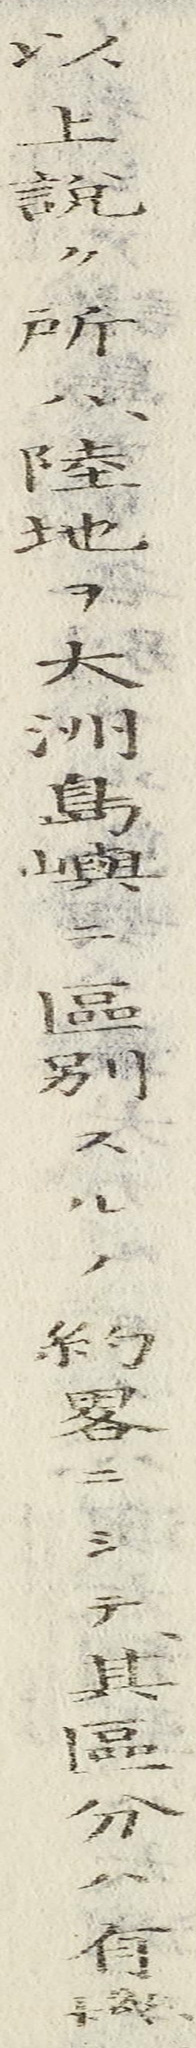以上説ク所ハ、陸地ヲ大洲島嶼ニ区別スルノ約略ニシテ、其区分ハ有機
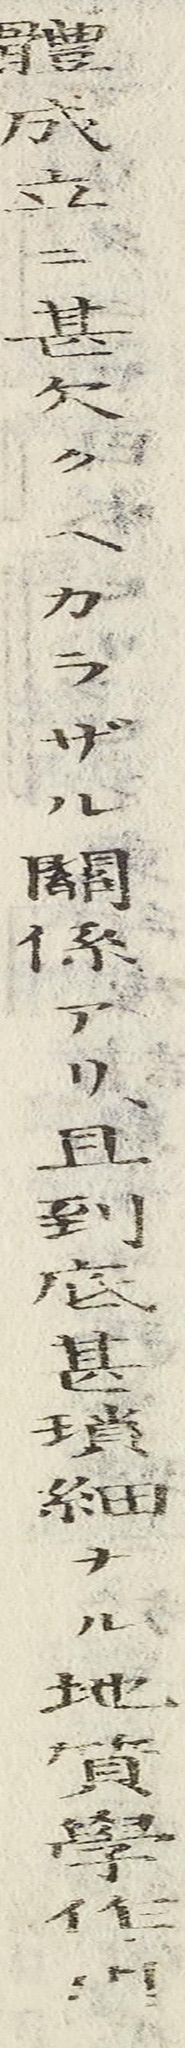体成立ニ甚欠クヘカラザル関係アリ、且到底甚瑣細ナル地質学作用ニ
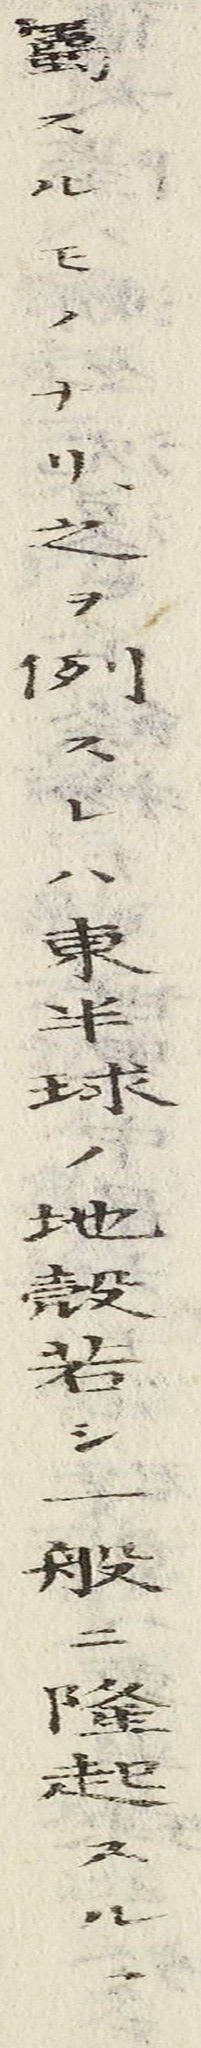属スルモノナリ、之ヲ例スレハ東半球ノ地殻若シ一般ニ隆起スルアラ
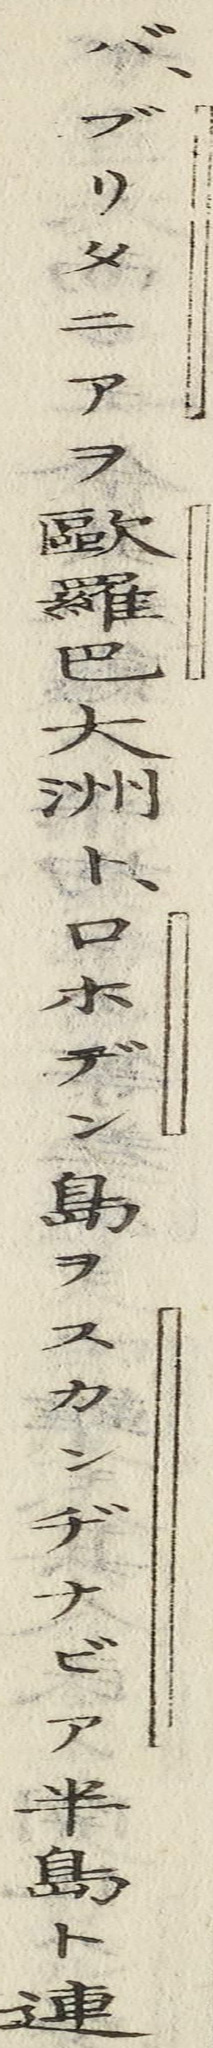バ、ブリタニアヲ欧羅巴大洲ト、ロホデン島ヲスカンヂナビア半島ト連
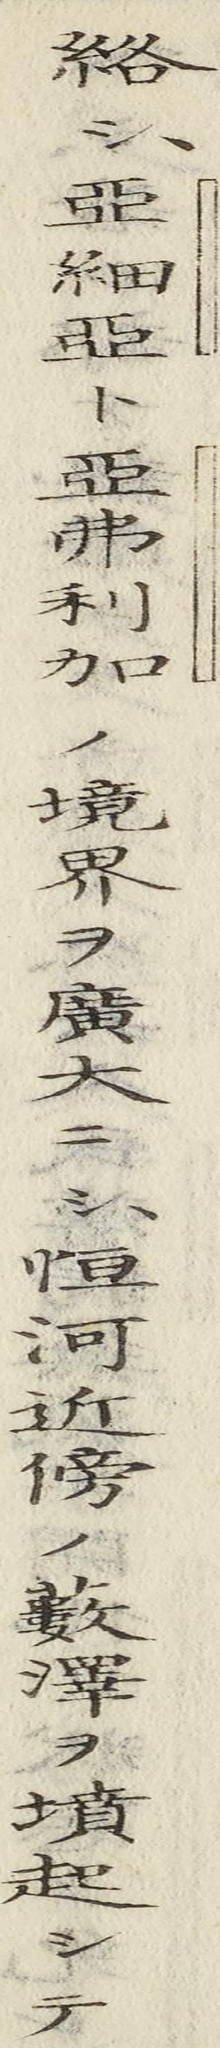絡シ、亜細亜ト阿弗利加ノ境界ヲ広大ニシ、恒河近傍ノ薮沢ヲ墳起シテ
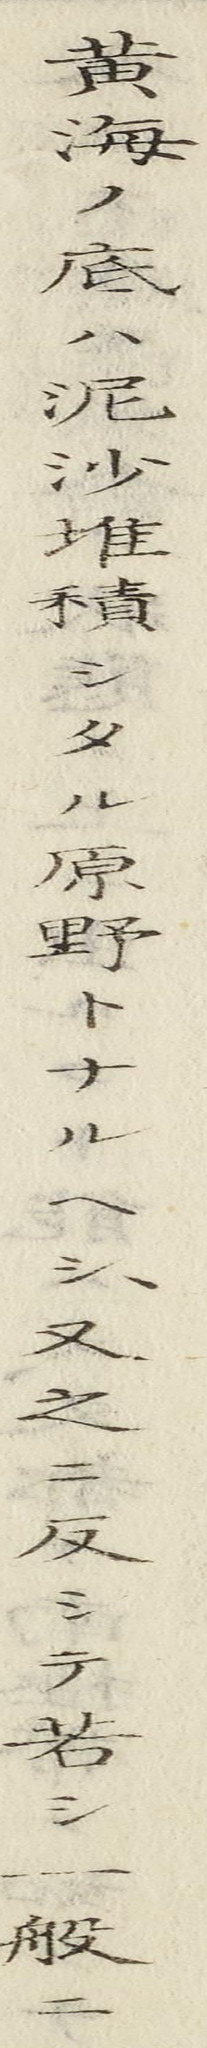黄海ノ底ハ泥沙堆積シタル原野トナルヘシ、又之ニ反シテ若シ一般ニ
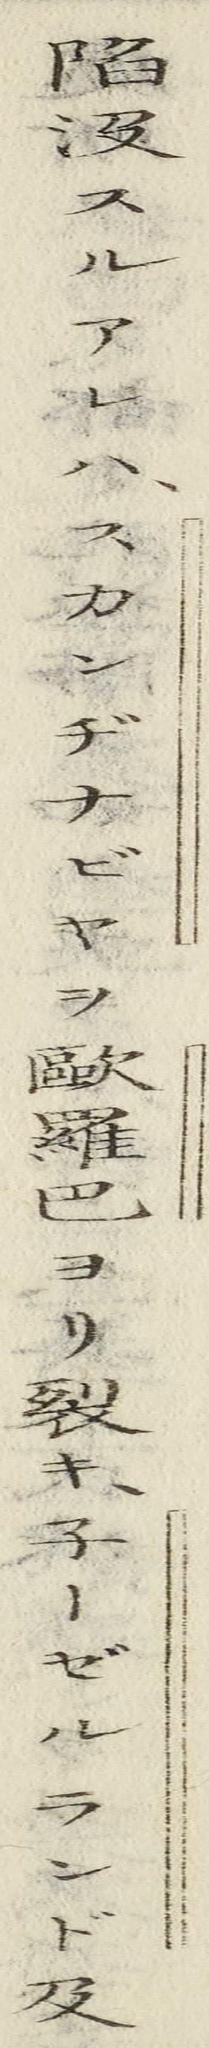陥没スルアレハ、スカンヂナビヤヲ欧羅巴ヨリ裂キ、ネーゼルランド及
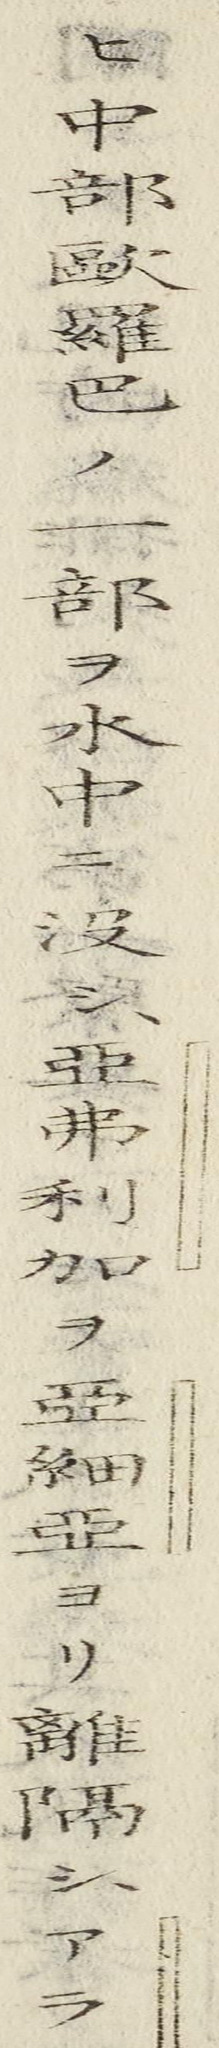ヒ中部欧羅巴ノ一部ヲ水中ニ没シ、阿弗利加ヲ亜細亜ヨリ離隔シ、アラ
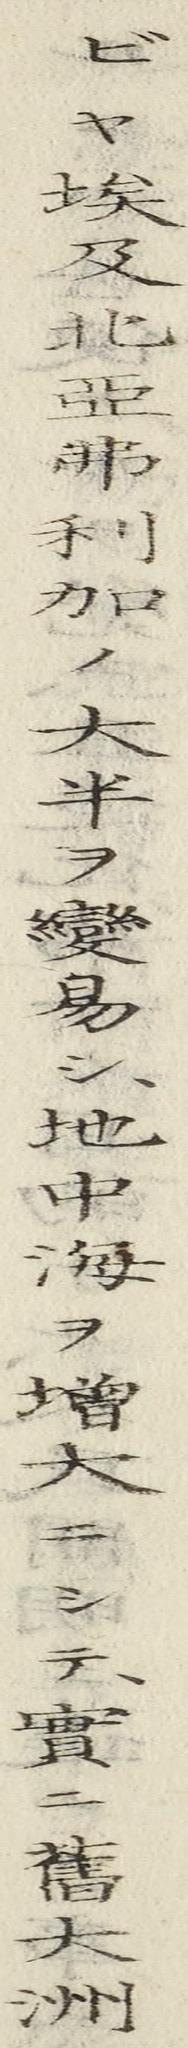ビヤ埃及北阿弗利加ノ大半ヲ変易シ、地中海ヲ増大ニシテ、実ニ旧大洲
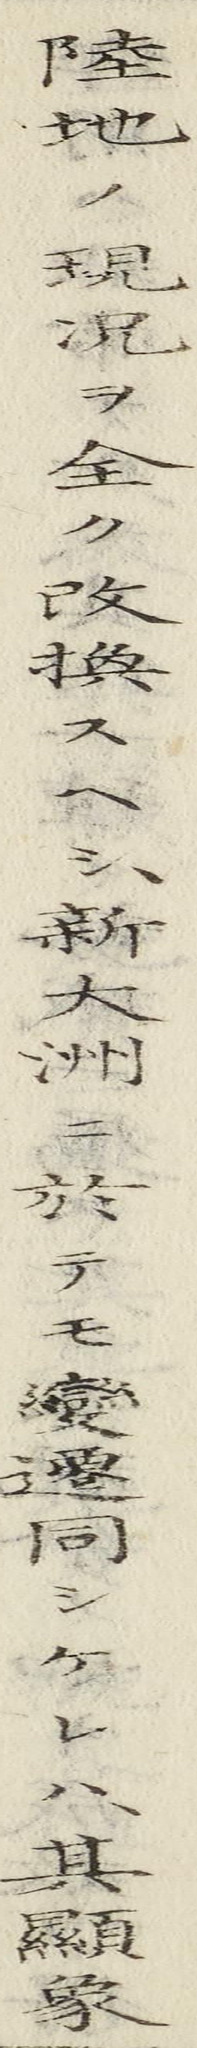陸地ノ現況ヲ全ク改換スヘシ、新大洲ニ於テモ変遷同シケレハ、其顕象
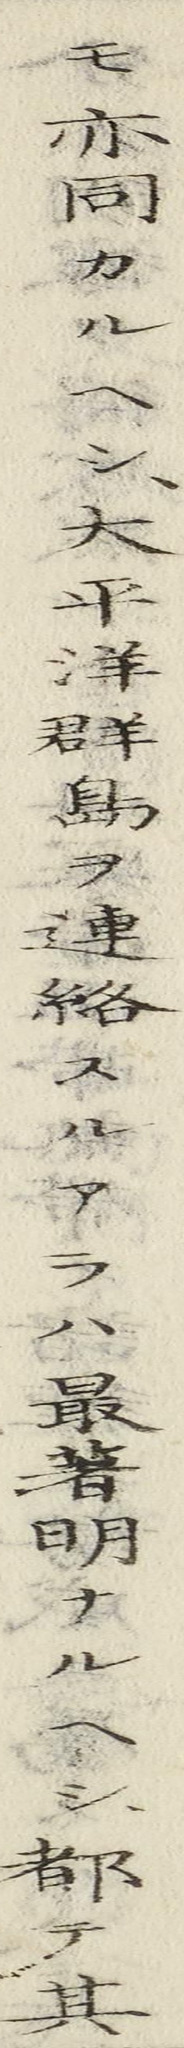モ亦同カルヘシ、大平洋群島ヲ連絡スルアラハ最著明ナルヘシ、都テ其
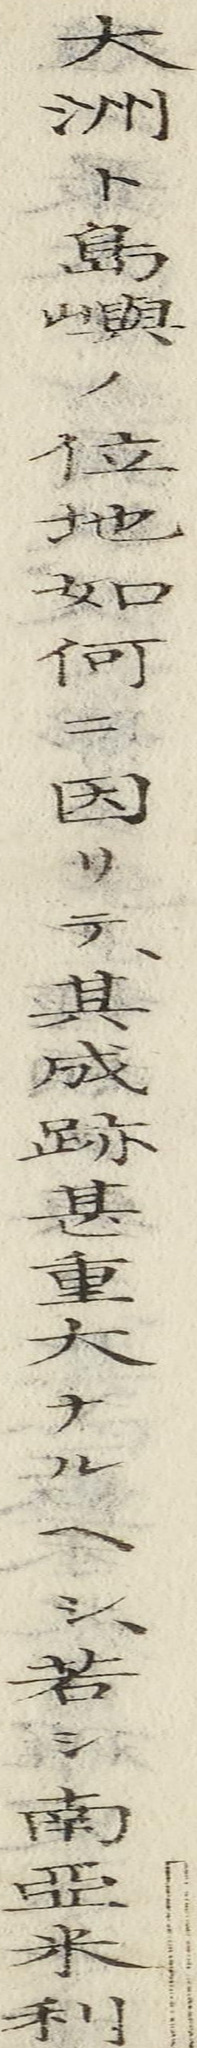大洲ト島嶼ノ位知如何ニ因リテ、其成跡甚重大ナルヘシ、若シ南亜米利
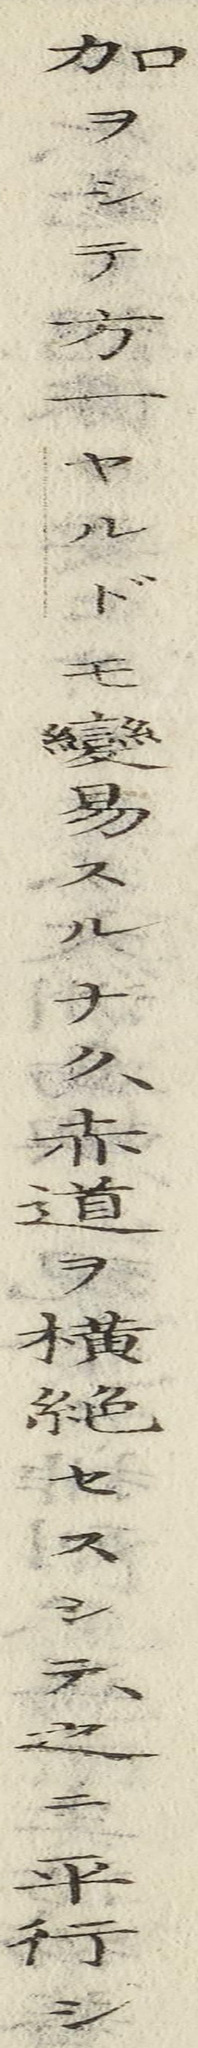加ヲシテ方一ヤルドモ変易スルナク、赤道ヲ横絶セスシテ、之ニ平行シ
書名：百科全書　地文學　全
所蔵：東京大学地震研究所図書室 Earthquake Research Institute Library, The University of Tokyo, JAPAN
